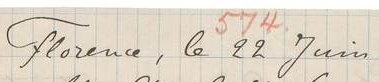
Florence, le 22 Juin
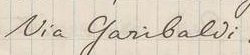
Via Garibaldi.
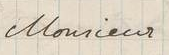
À Monsieur
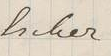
Escher
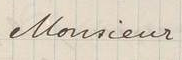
Monsieur
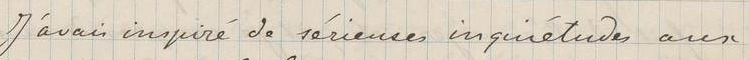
J'avais inspiré de sérieuses inquiétudes aux
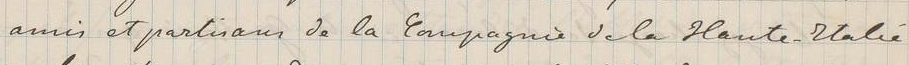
amis et partisans de la Compagnie de la Haute-Italie
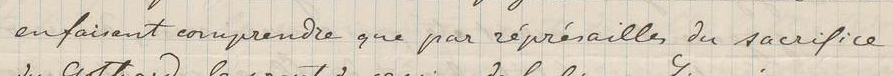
en faisant comprendre que par réprésailles du sacrifice
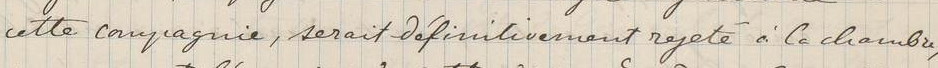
cette compagnie, serait définitivement rejeté à la chambre,
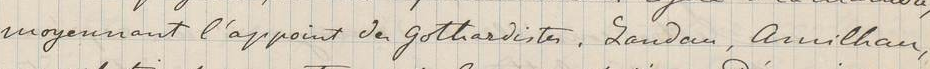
moyennant l'appoint des Gothardistes. Landau, Amilhan,
